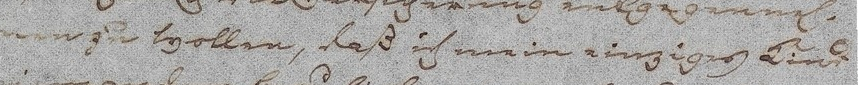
men zu wollen, daß ich mein einziges Kind
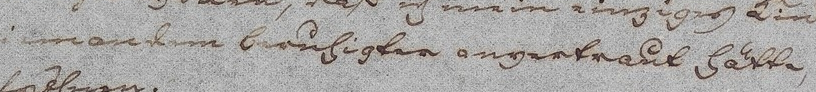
niemandem beruhigter anvertraut hätte,
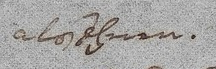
als Ihnen.
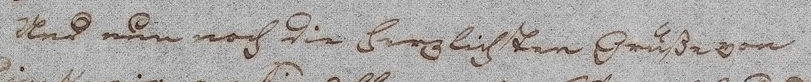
Und nun noch die herzlichsten Grüße von
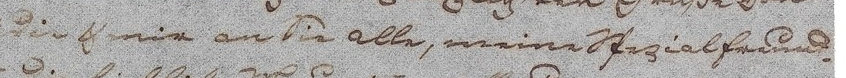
Lydie & mir an Sie alle, meine Spezialfreund-
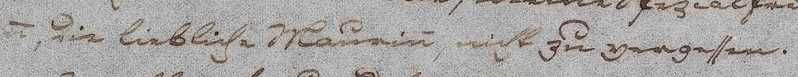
inn, die liebliche Maurinn, nicht zu vergessen.
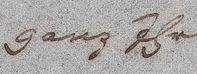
ganz Ihr
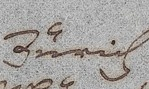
Zürich
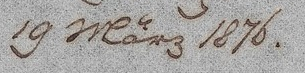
19 März 1876.
